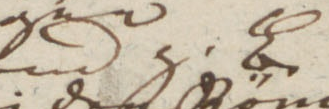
und z. B.
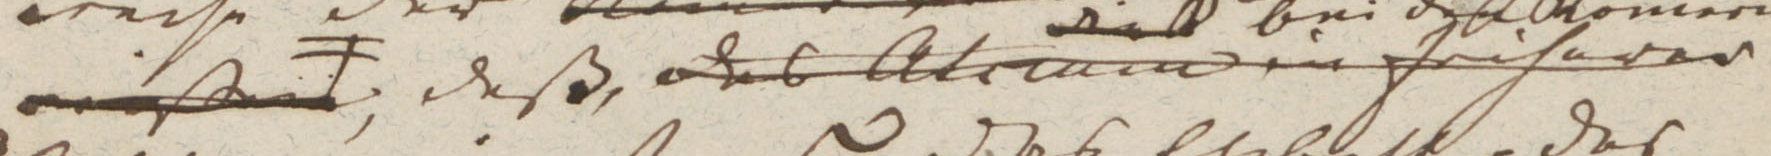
wissen %, dass, das Atrium in früherer
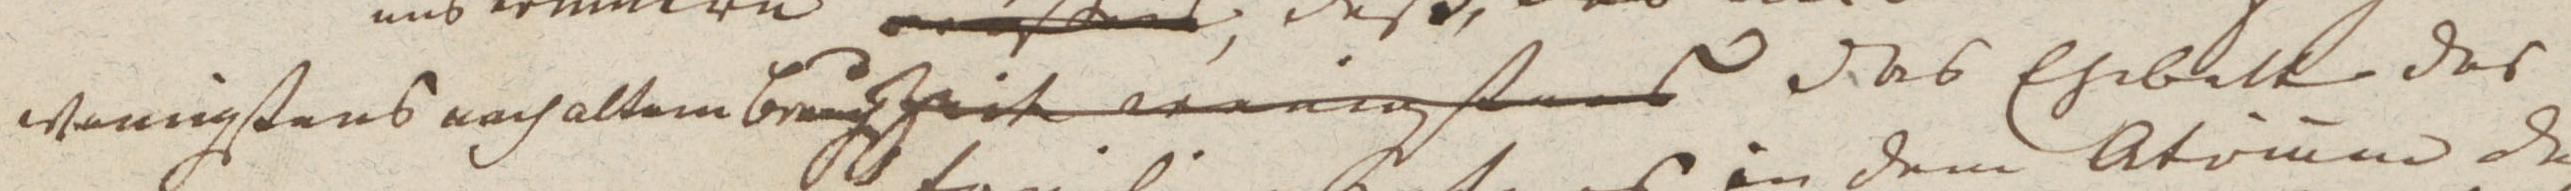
wenigstens nach altem Brauch Zeit wenigstens das Ehebett des
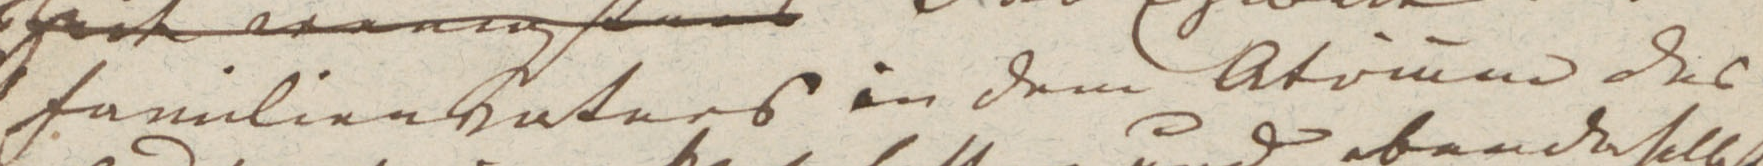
Familienvaters in dem Atrium des
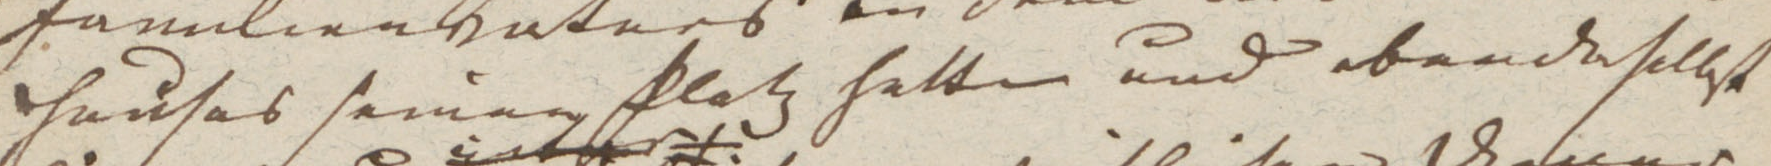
Hauses seinen Platz hatte und ebendaselbst
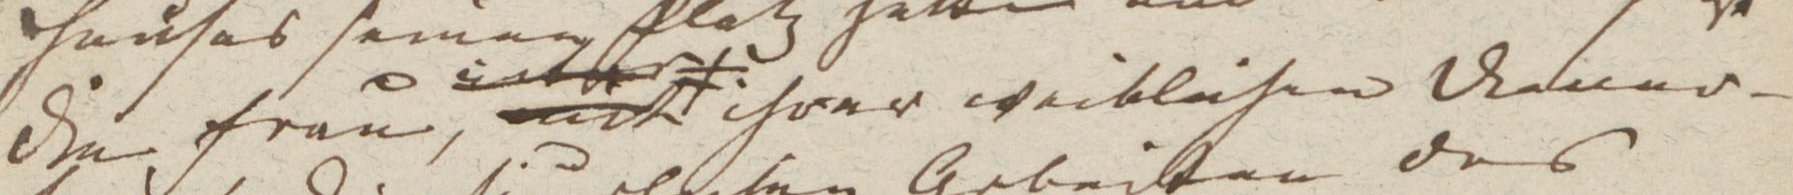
die Frau, mit unter % ihrer weiblichen Diener-
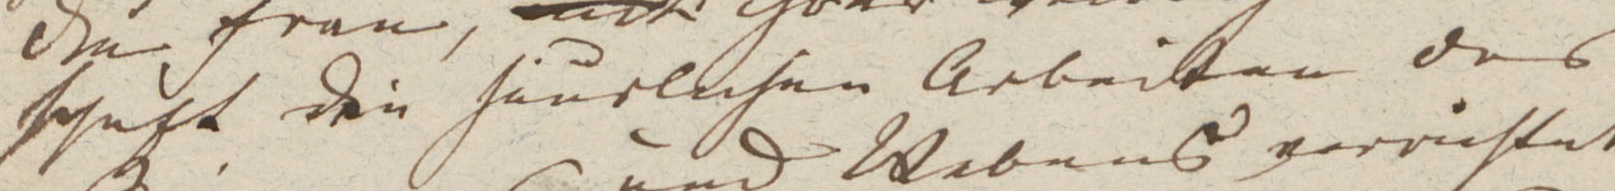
schaft die häuslichen Arbeiten des
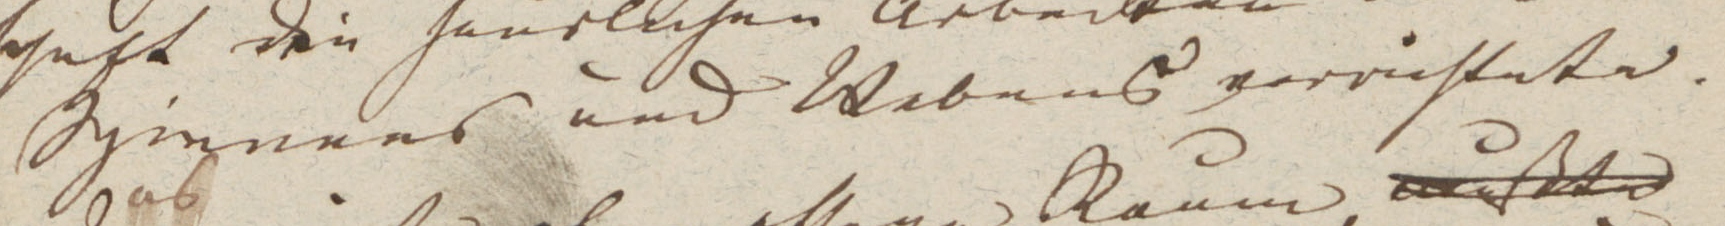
Spinnens und Webens verrichtete.
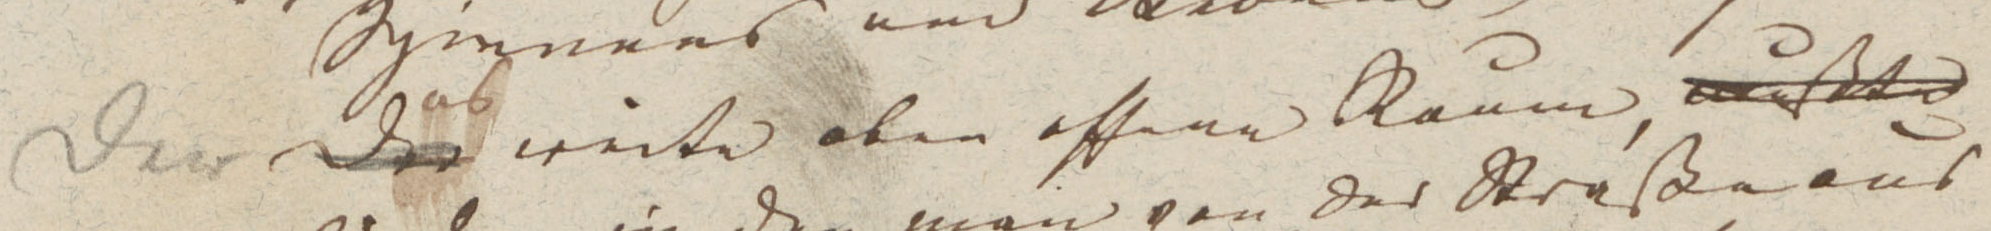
Der Deras weite oben offene Raum, musste
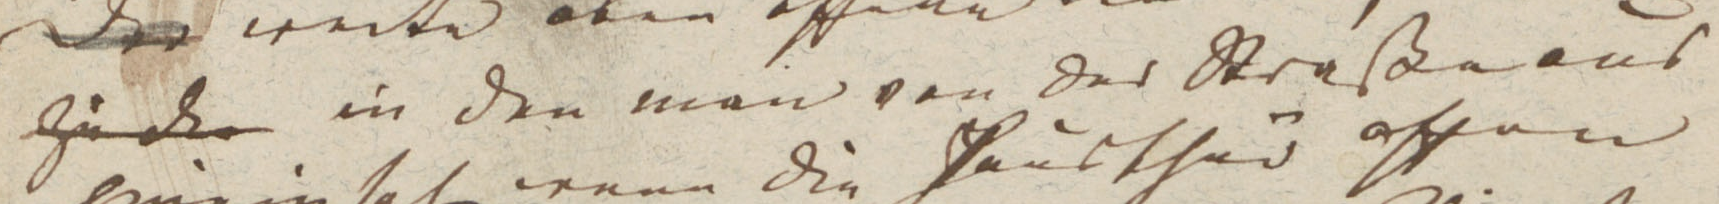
zu d in den man von der Strasse aus
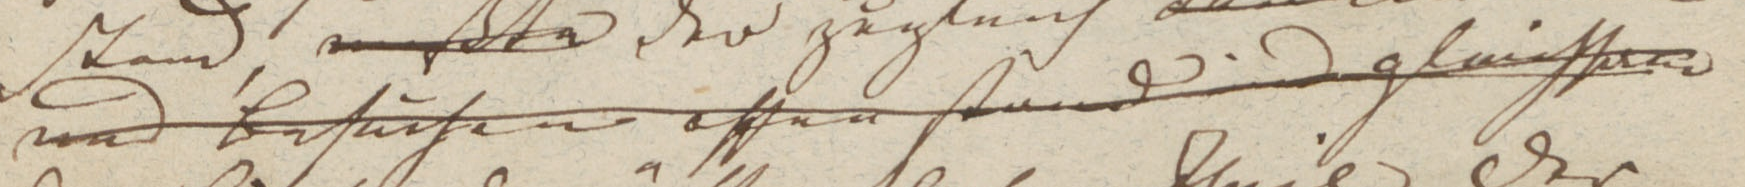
und Besuchen offen stand und gleichsam
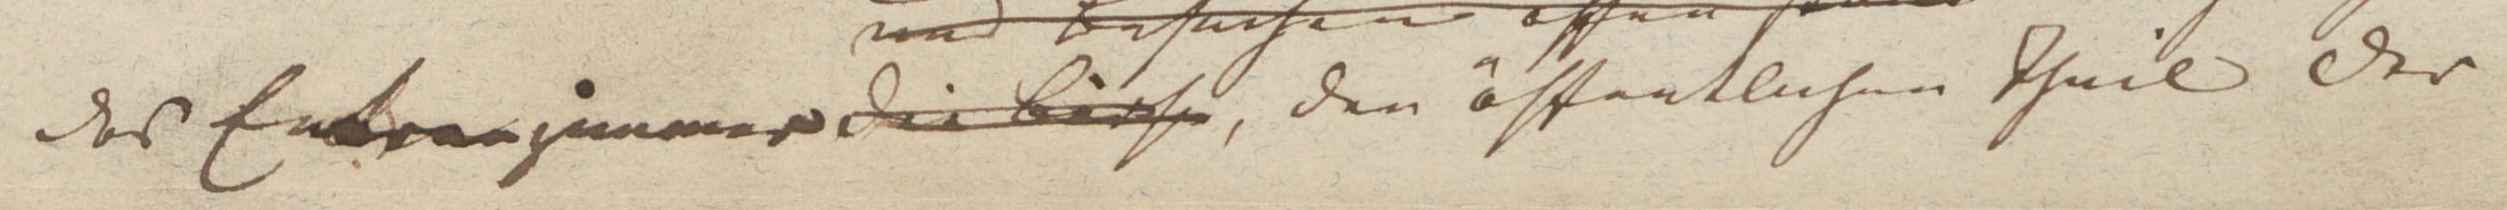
das Entreezimmer die , den öffentlichen Theil der
